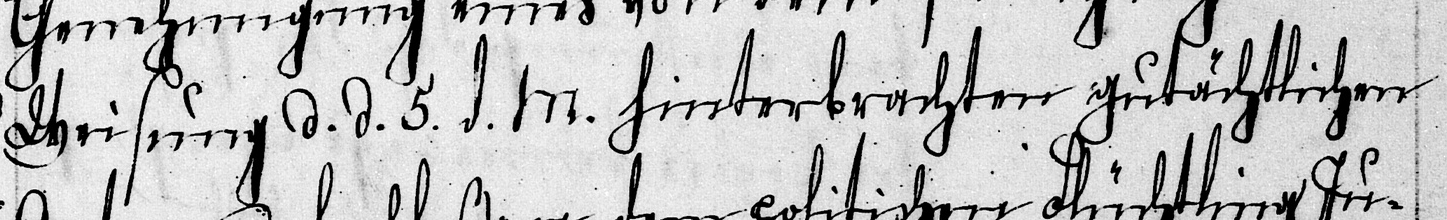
Weisung d. d. 5. d. M. hinterbrachten gutächtlichen
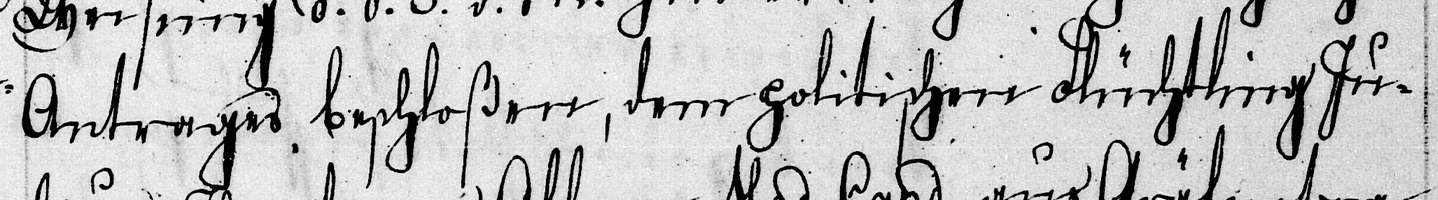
Antrages beschloßen, dem politischen Flüchtling Ju¬
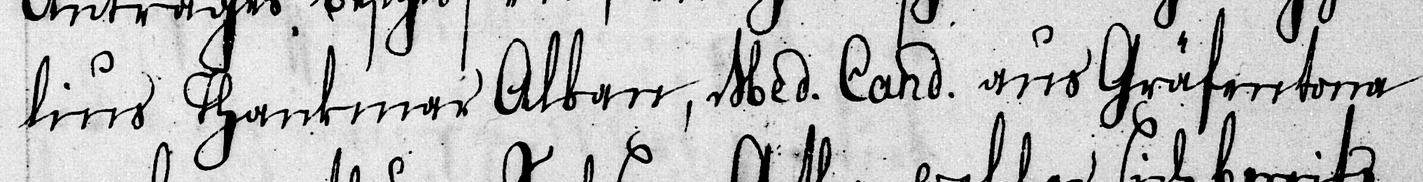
lius Thankmar Alban, Med. Cand. aus Gräfentona
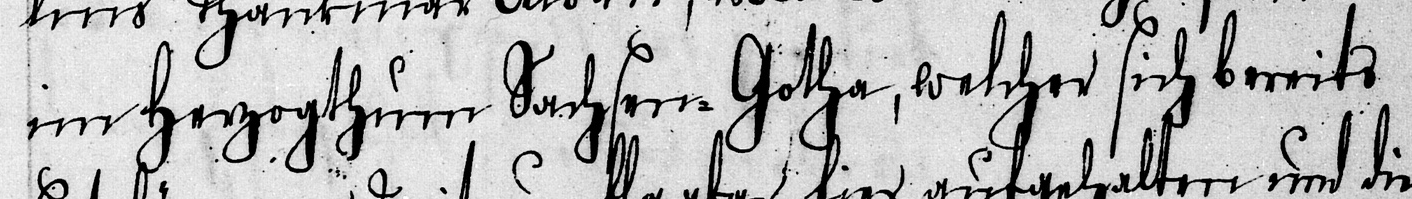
im Herzogthum Sachsen-Gotha, welcher sich bereits
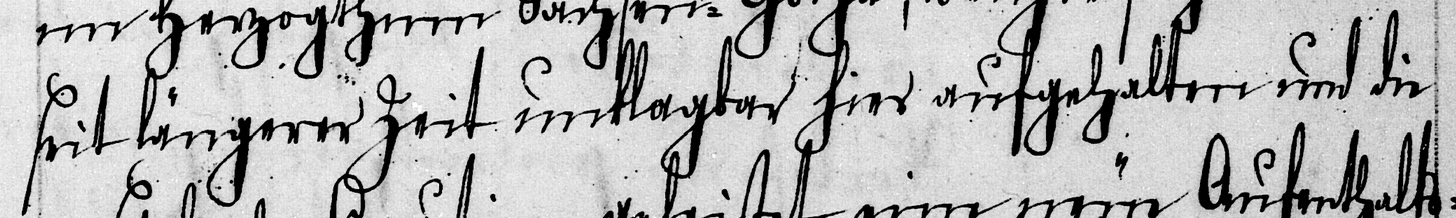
seit längerer Zeit unklagbar hier aufgehalten und die
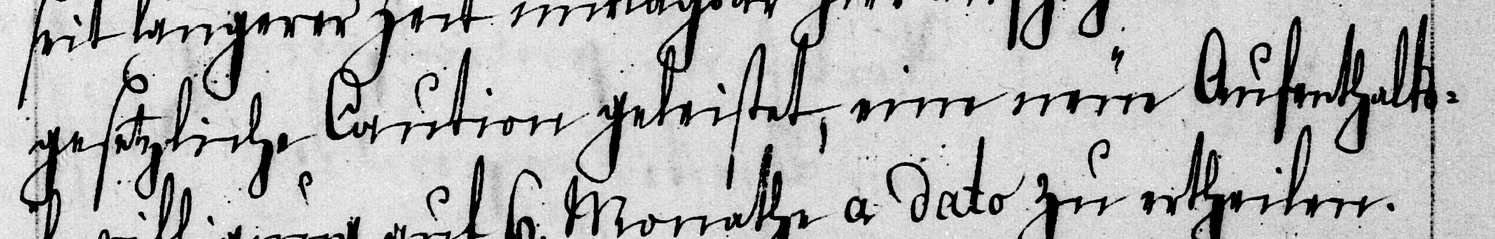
gesetzliche Caution geleistet, eine neue Aufenthalts¬
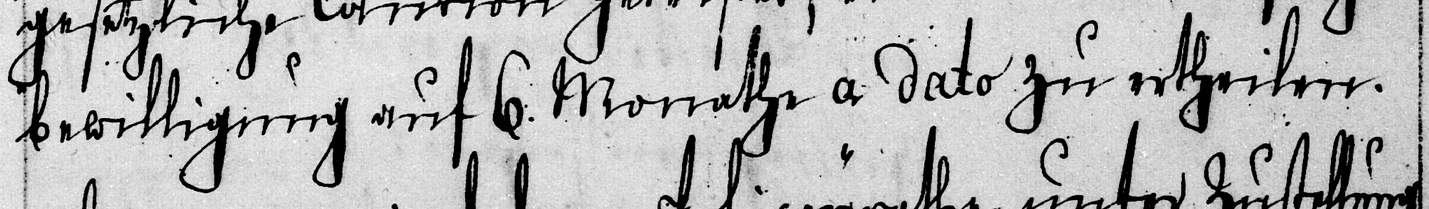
bewilligung auf 6. Monathe a dato zu ertheilen.
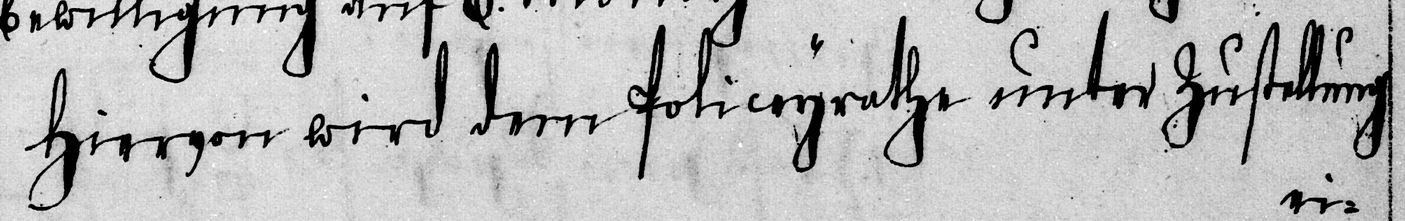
Hiervon wird dem Policeyrathe unter Zustellu¬
